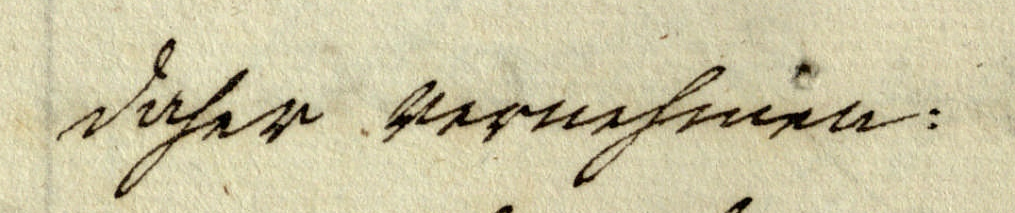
daher vernehmen:
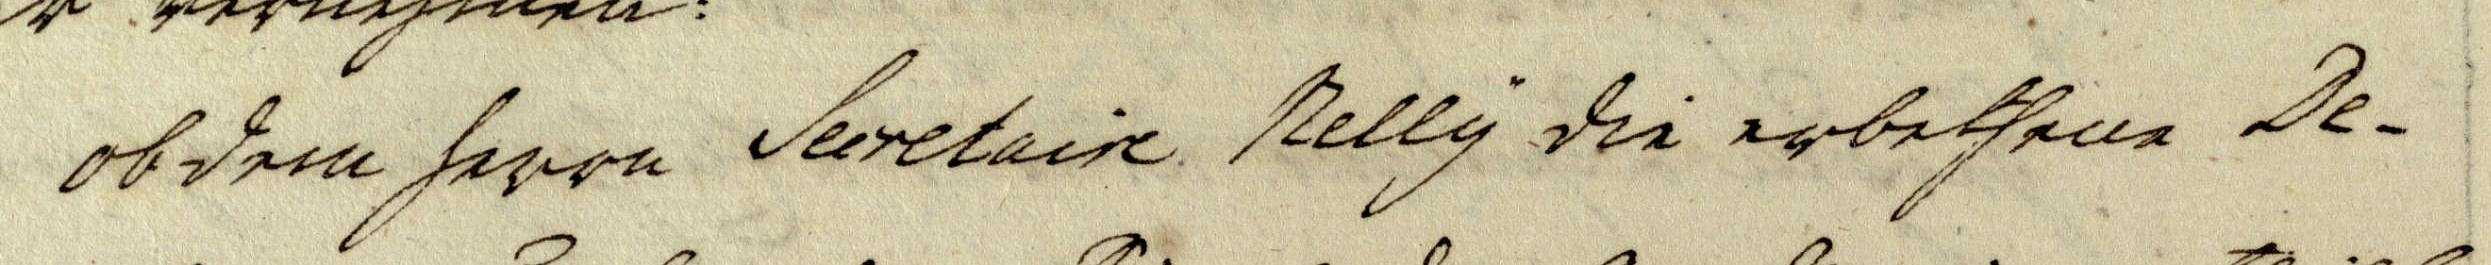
ob dem Herrn Secretaire Nellÿ die erbethene De¬
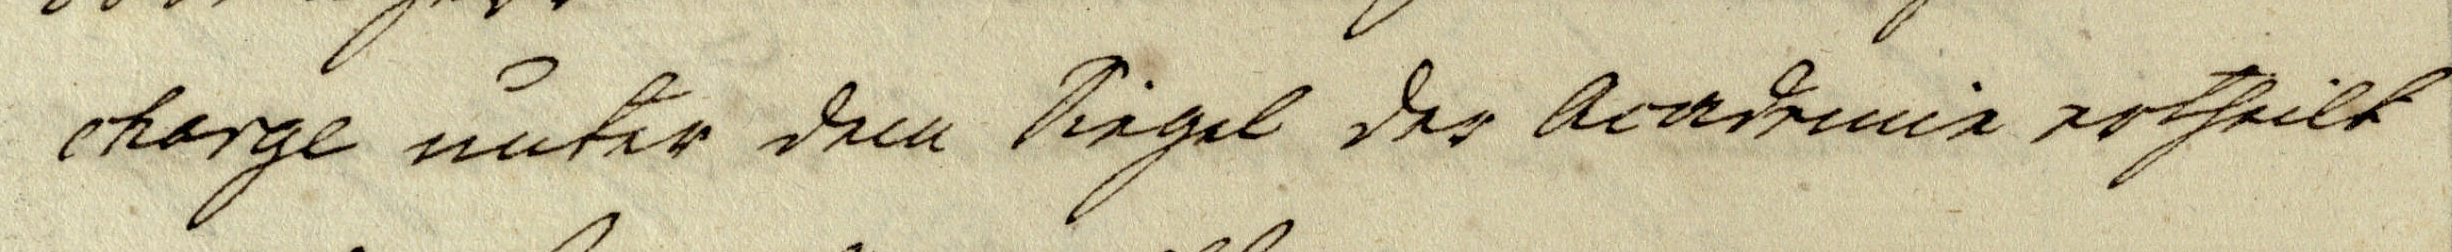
charge unter dem Siegel der Academie ertheilt
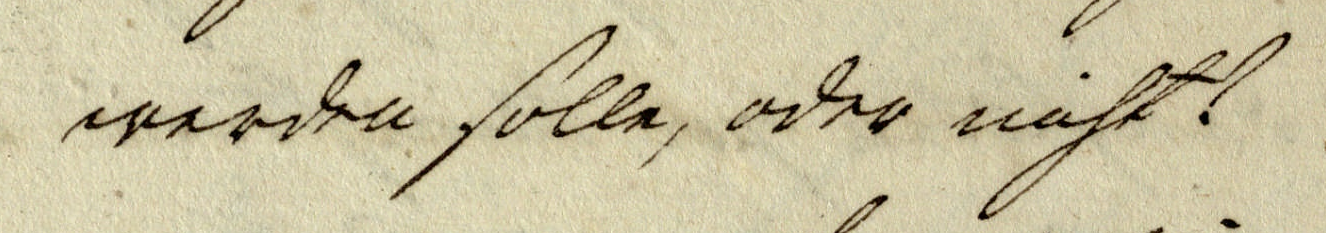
werden solle, oder nicht?
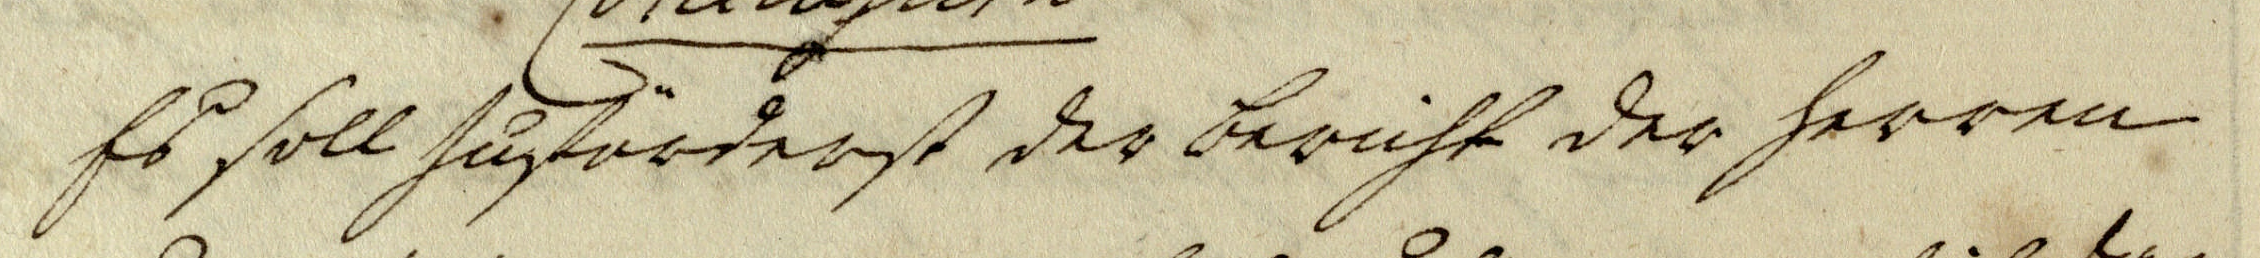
Es soll zuförderst der Bericht der Herren
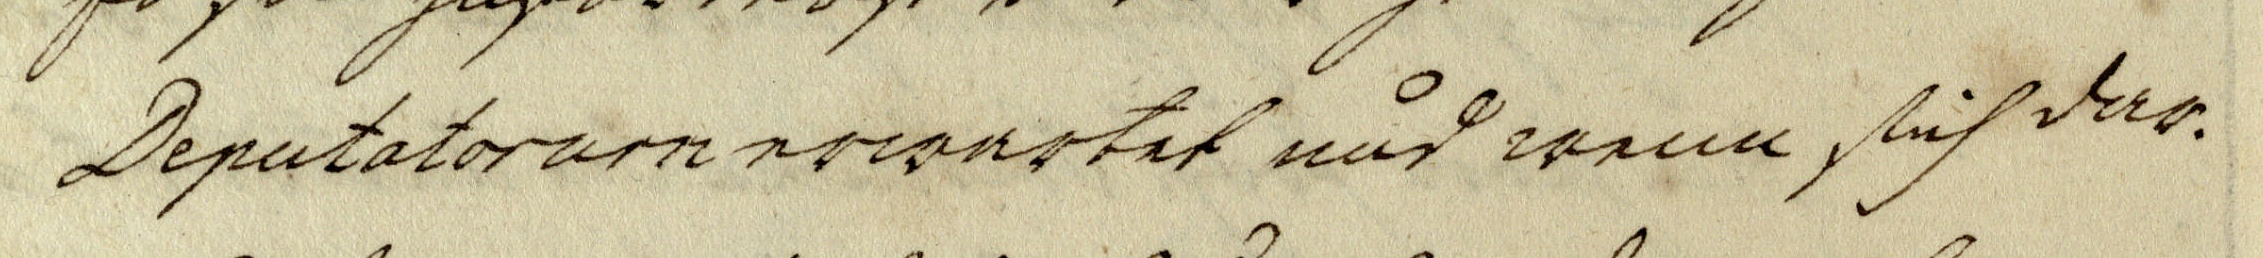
Deputatorum erwartet und wenn sich dar¬
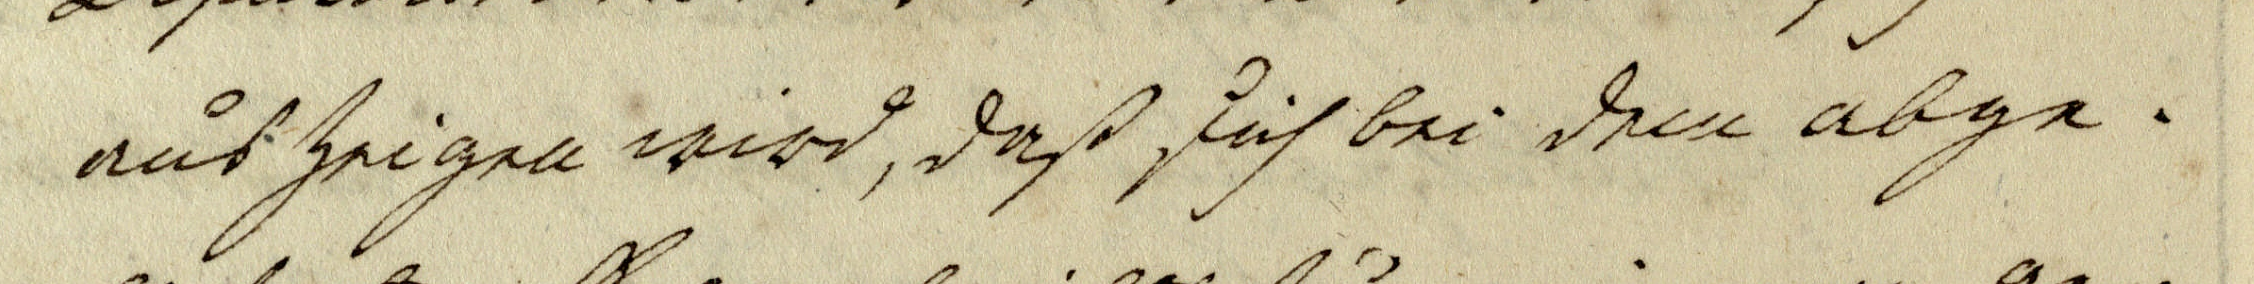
aus zeigen wird, daß sich bei dem abge¬
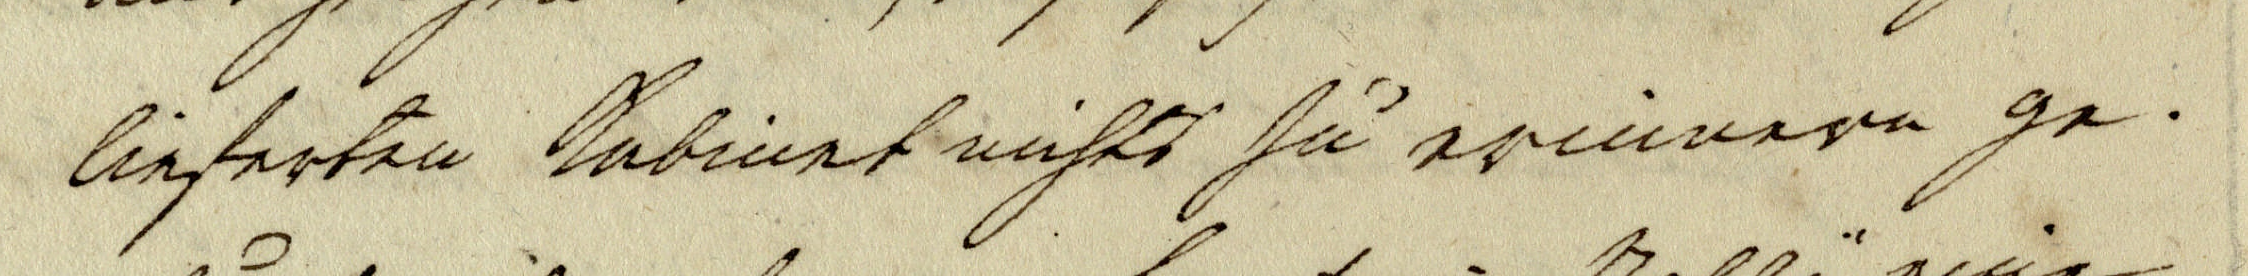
lieferten Kabinet nichts zu erinnern ge¬
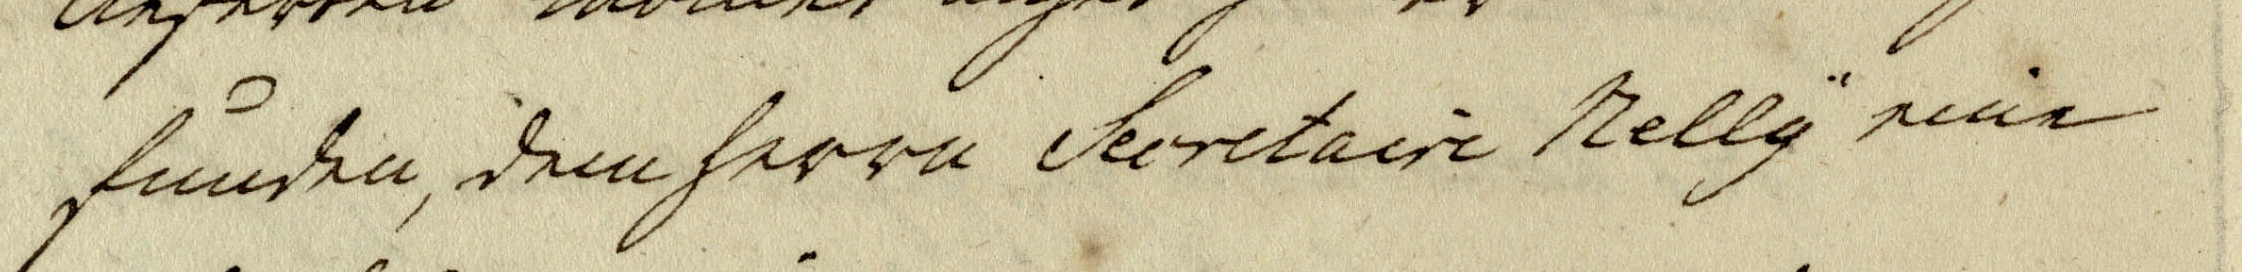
funden, dem Herrn Secretaire Nellÿ eine
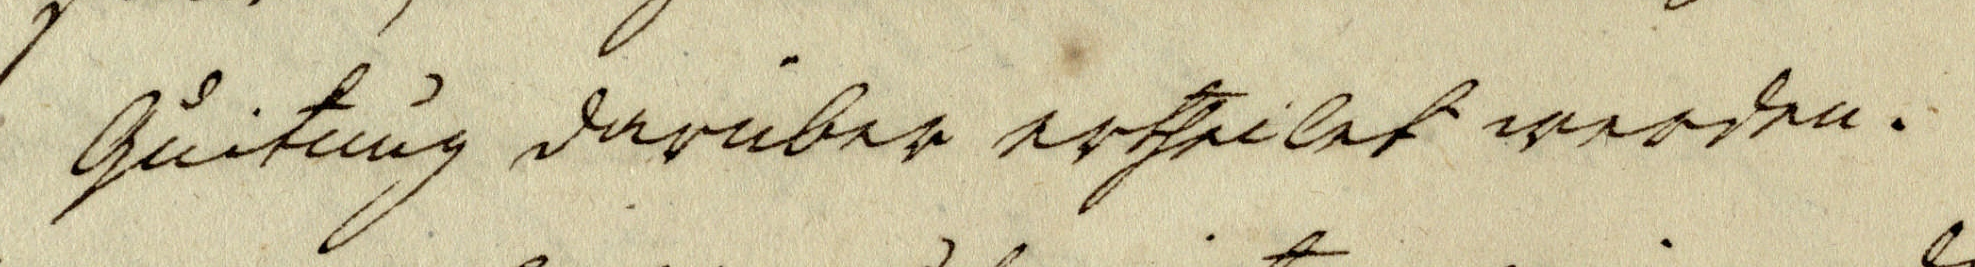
Quitung darüber ertheilet werden.
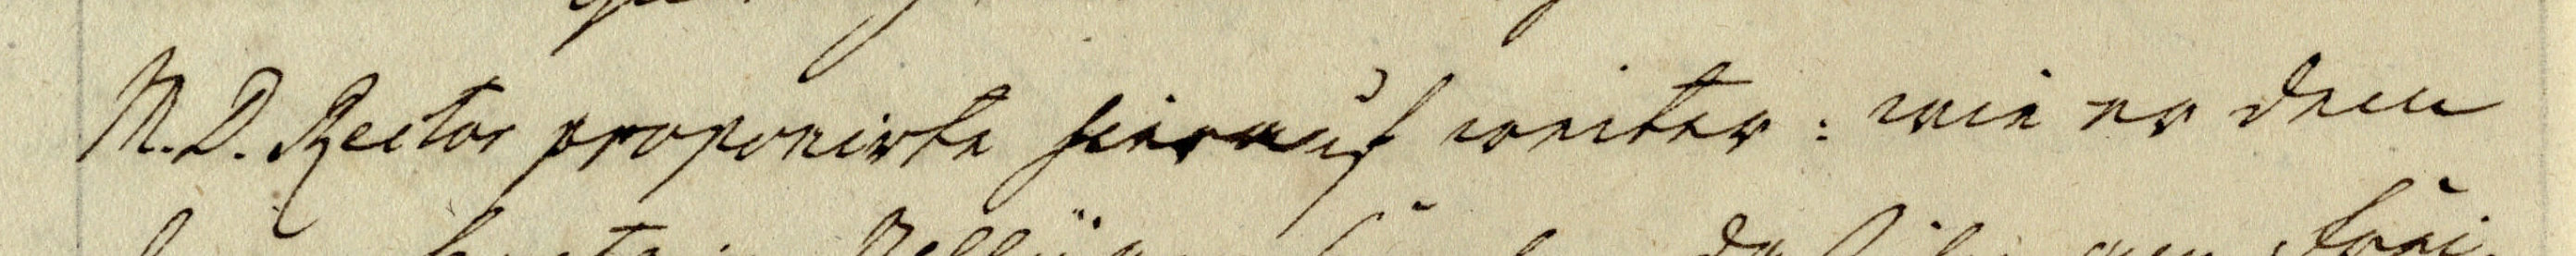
M. D. Rector proponirte hierauf weiter: wie er dem
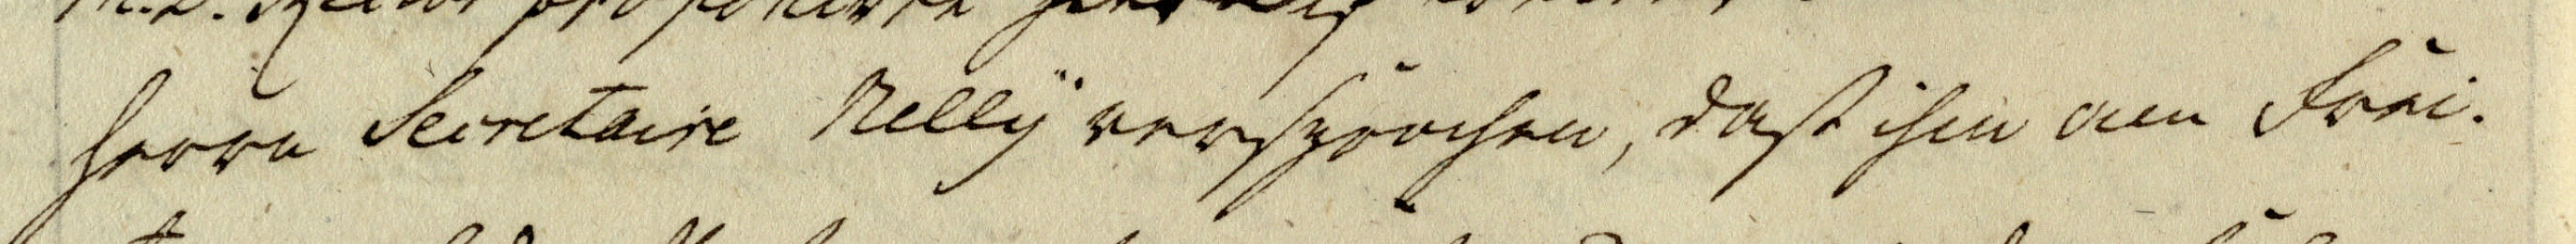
Herrn Secretaire Nellÿ versprochen, daß ihm am Frei¬
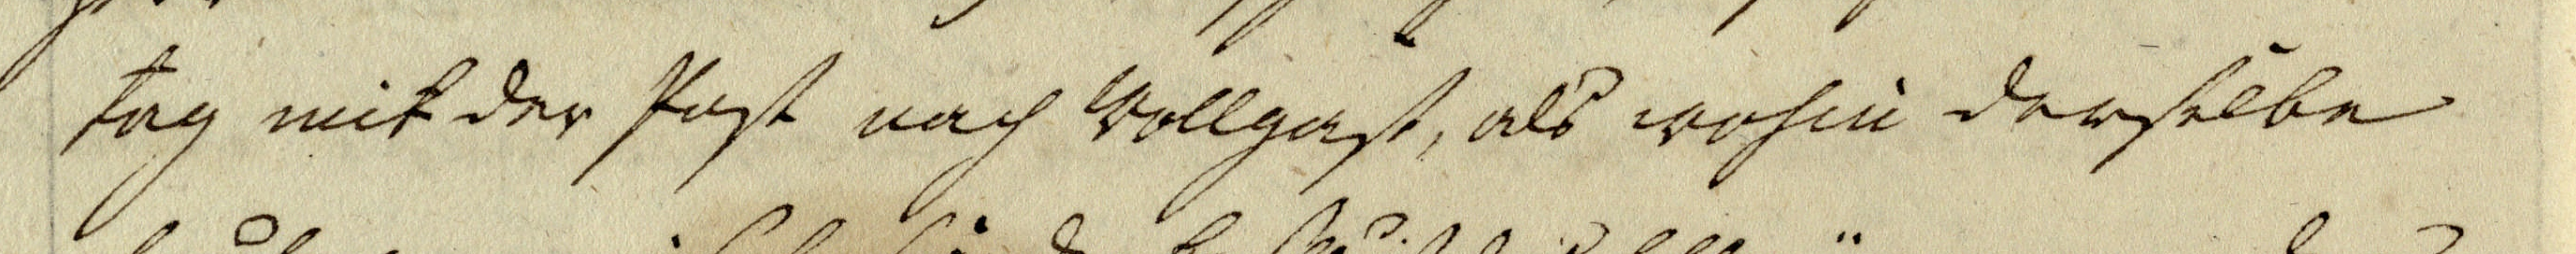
tag mit der Post nach Wollgast, als wohin derselbe
